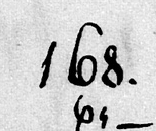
160.
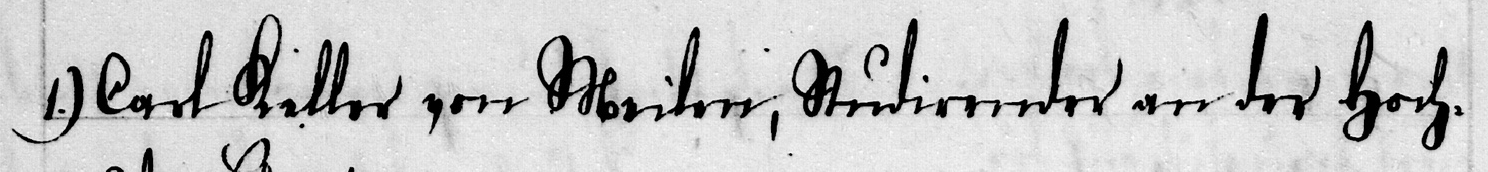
1.) Carl Keller von Meilen, Studirender an der Hoch¬
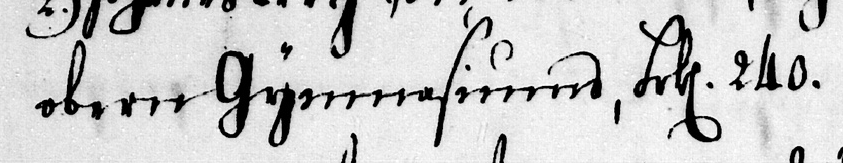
obern Gymnasiums, Frk[en]. 240.
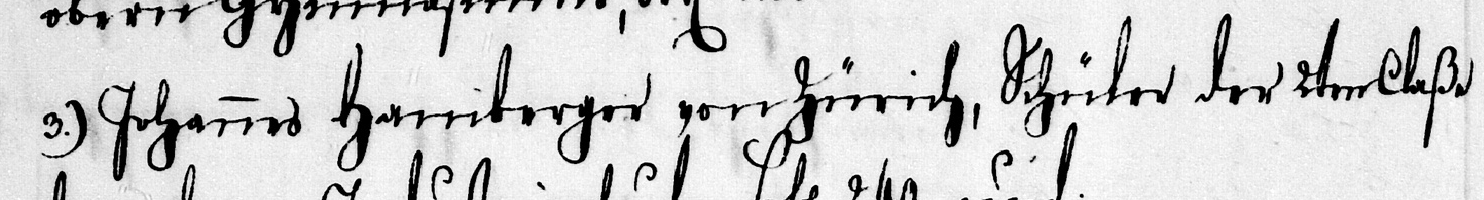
3.) Johannes Hamberger von Zürich, Schüler der 2ten Claße
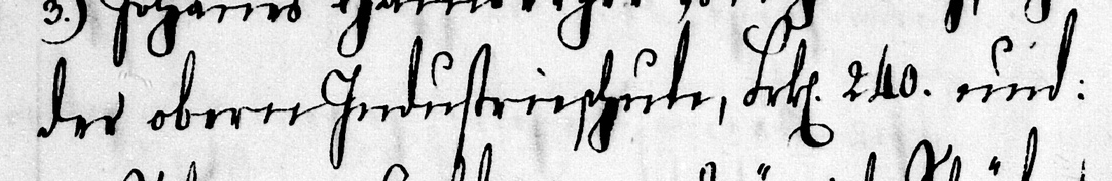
der obern Industrieschule, Frk[en]. 240. und:
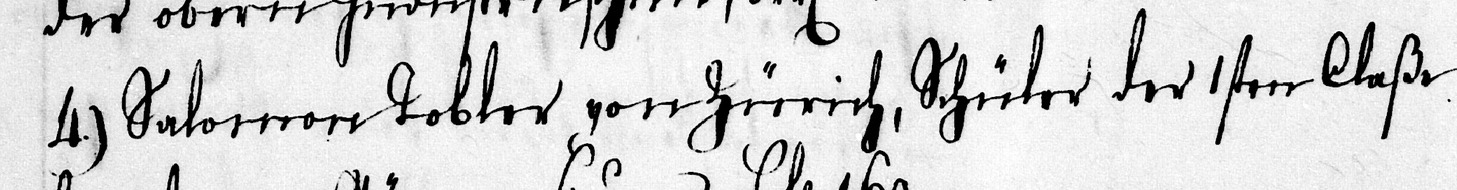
4.) Salomon Tobler von Zürich, Schüler der 1sten Claße
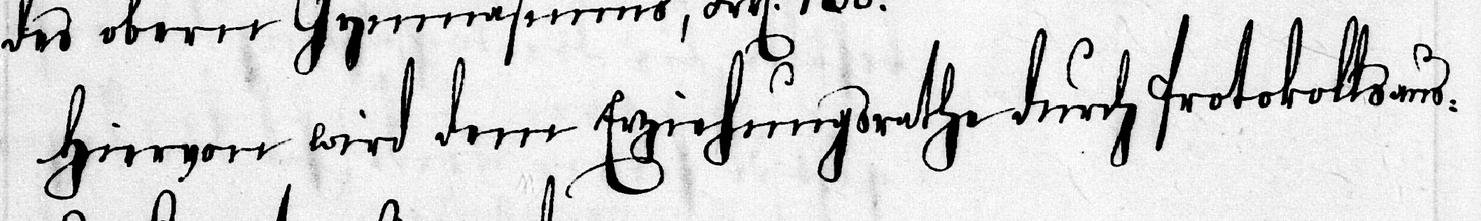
Hiervon wird dem Erziehungsrathe durch Protokollsau¬
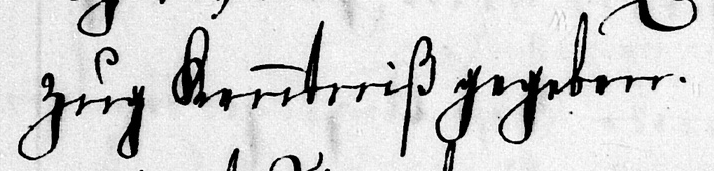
szug Kenntniß gegeben.
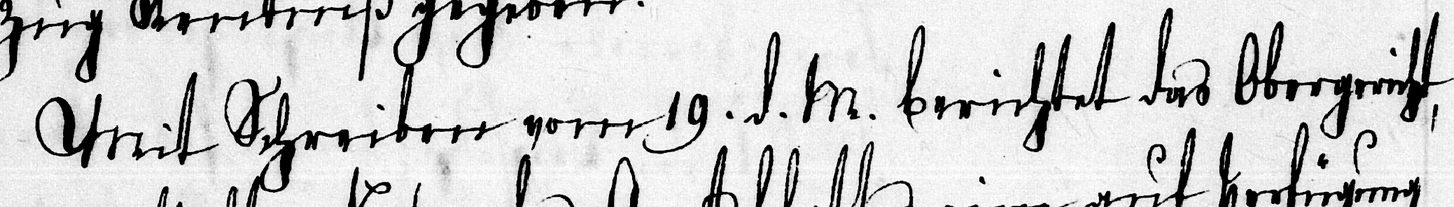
Mit Schreiben vom 19. d. M. berichtet das Obergerich¬
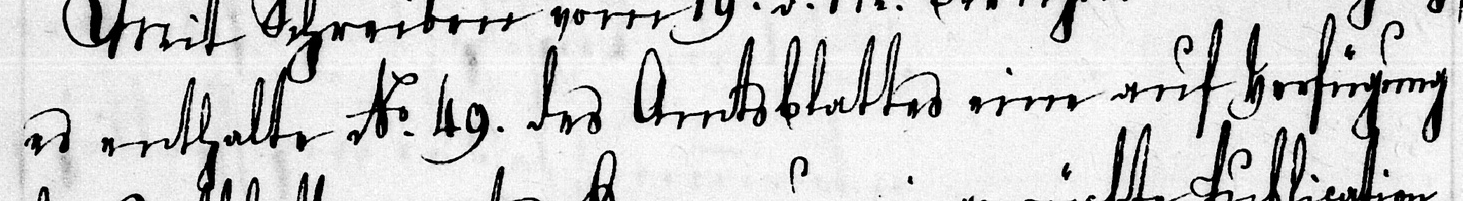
es enthalte No. 49. des Amtsblattes eine auf Verfügung
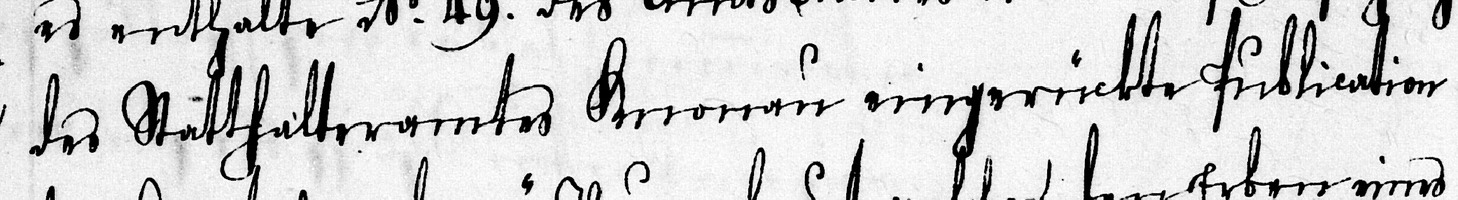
des Statthalteramtes Knonau eingerückte Publication
